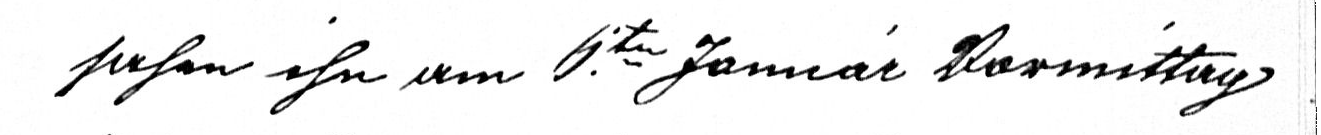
sahen ihn am 6ten Január Vormittag
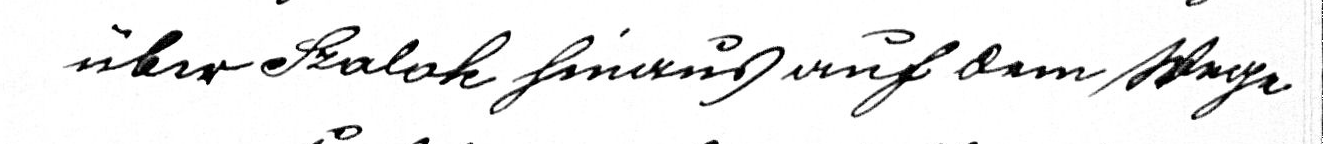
über Szalok hinaus auf dem Wege
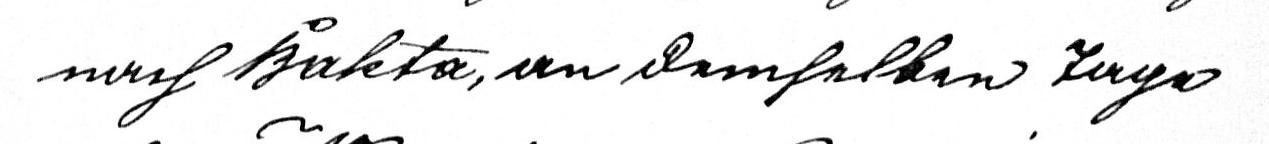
nach Bakta, an demselben Tage
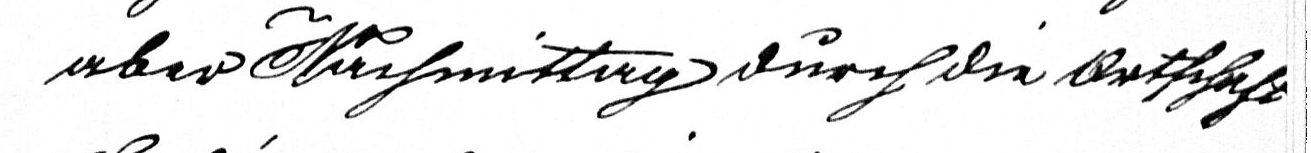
aber Nachmittag durch die Ortschaft
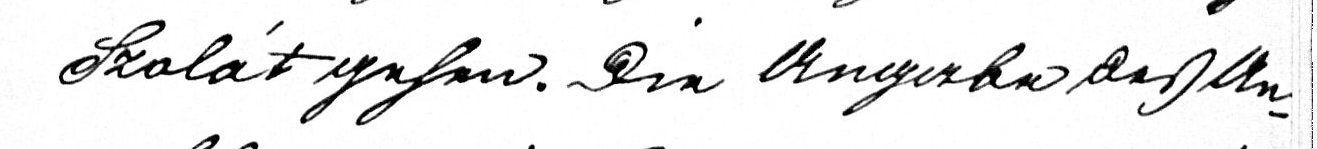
Szolát gehen. Die Angabe des An¬
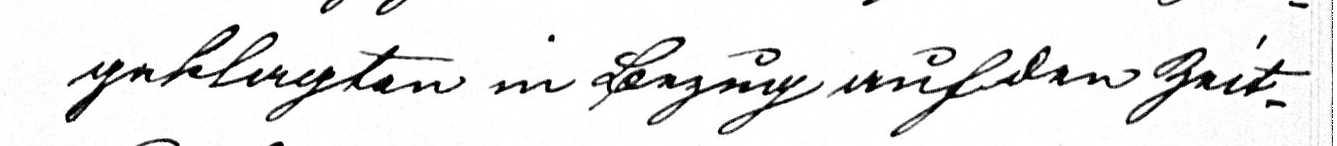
geklagten in Bezug auf den Zeit¬
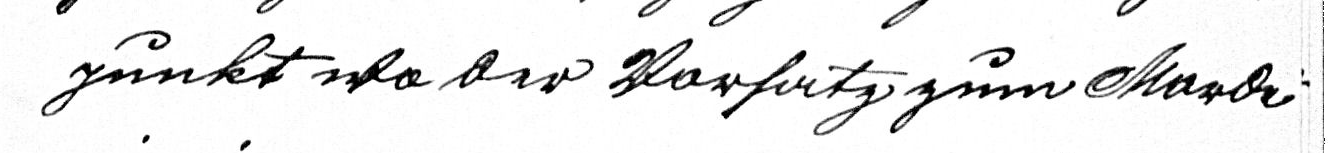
punkt wo der Vorsatz zum Morde
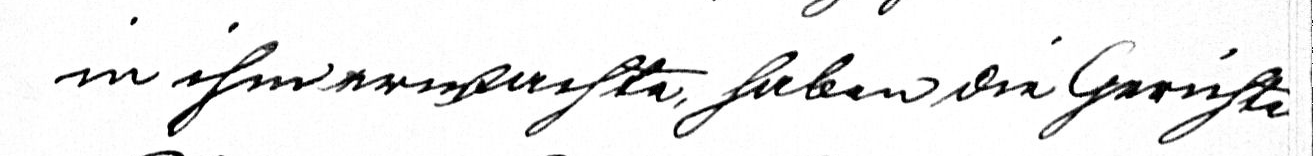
in ihm erwachte, haben die Gerichte
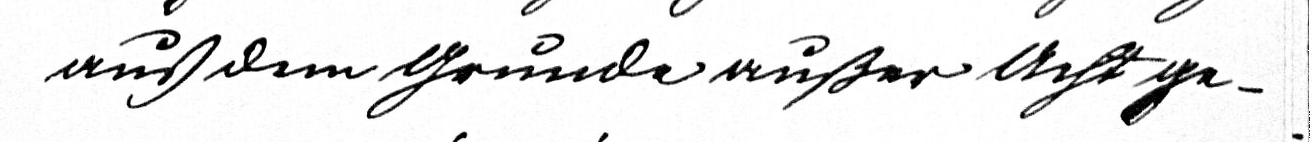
aus dem Grunde außer Acht ge¬
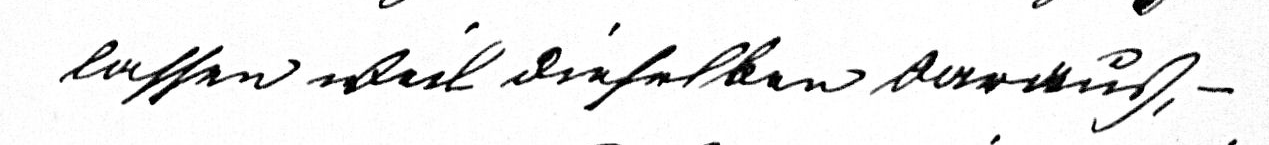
lassen weil dieselben daraus, -
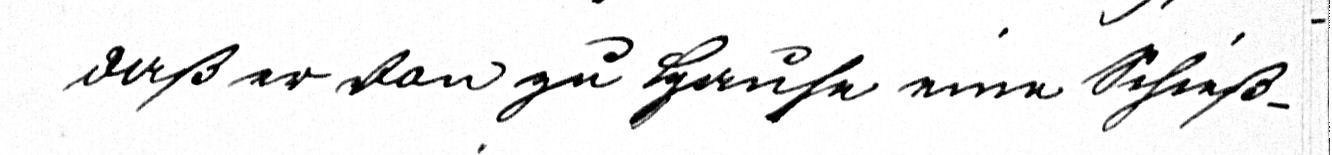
daß er von zu Hause eine Schieß¬
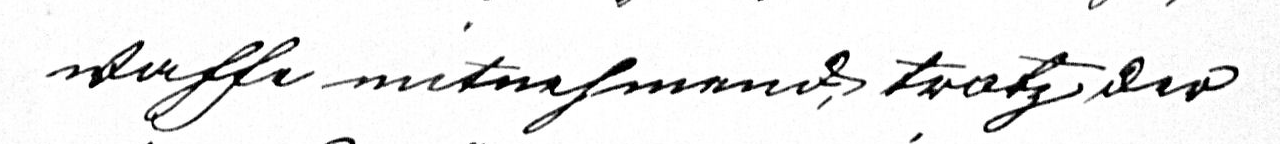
waffe mitnehmend, trotz der
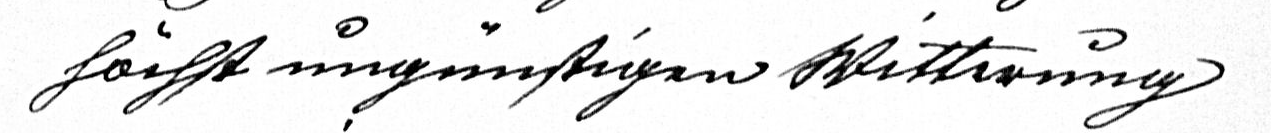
höchst ungünstigen Witterung
